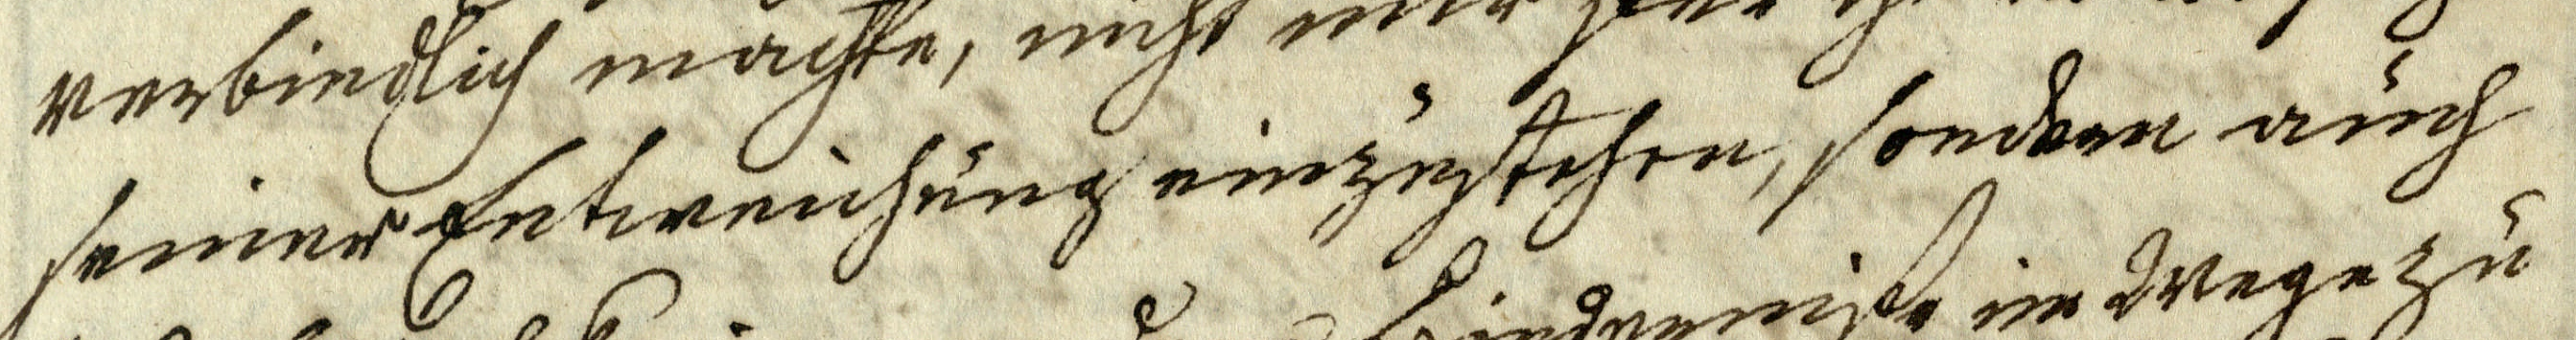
seiner Entweichung einzustehen, sondern auch
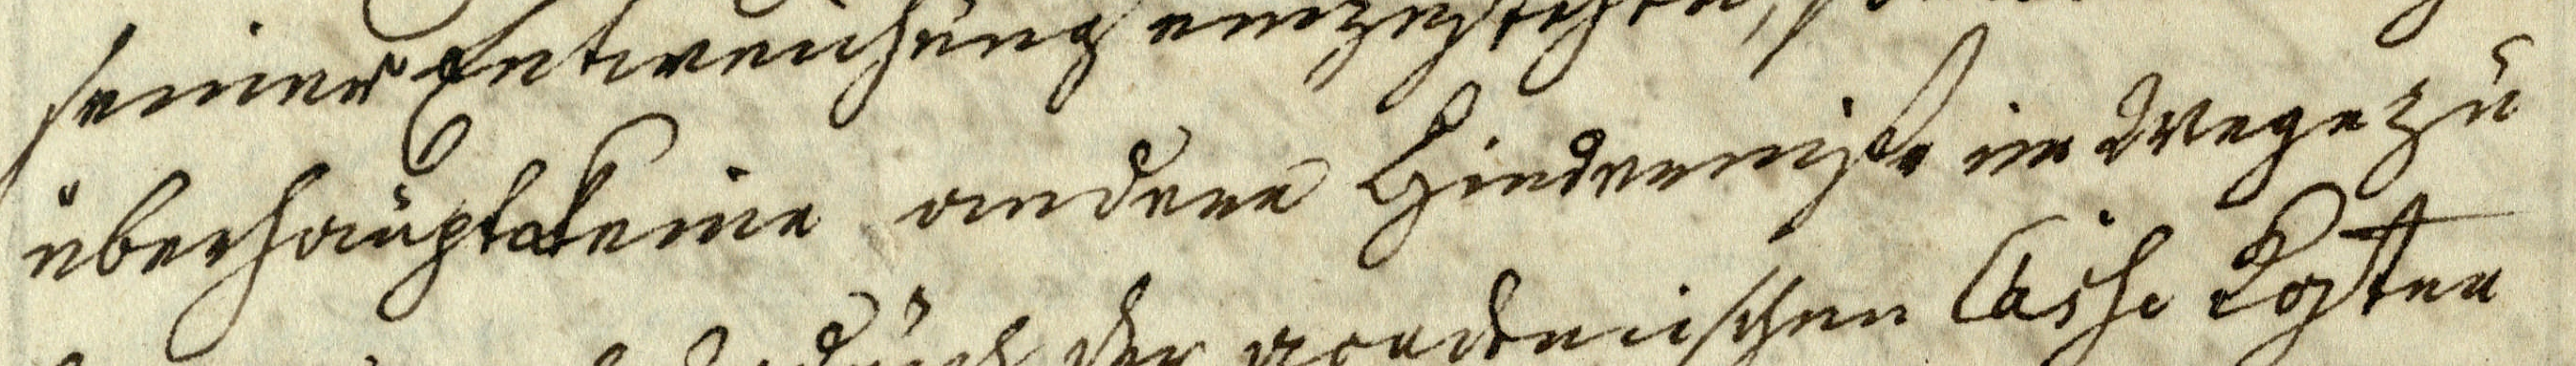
überhauptkeine andern Hinderniße im Wege zu
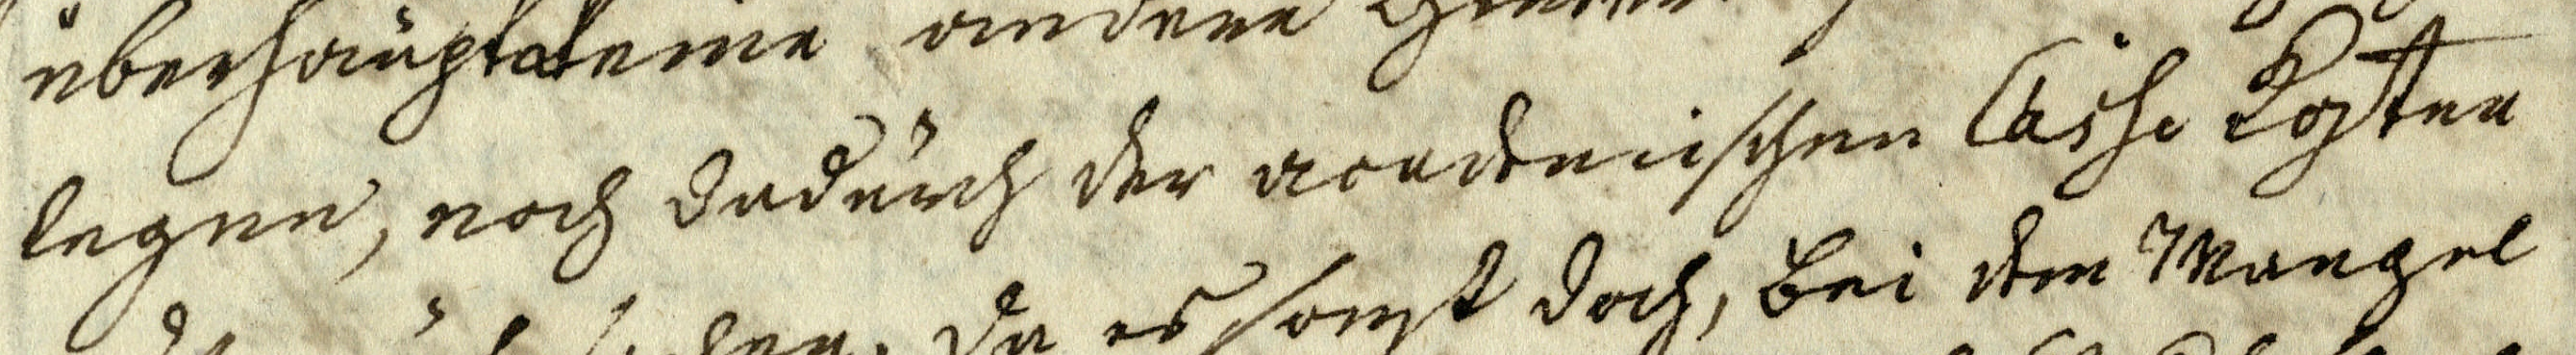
legen, noch dadurch der academischen Casse Kosten
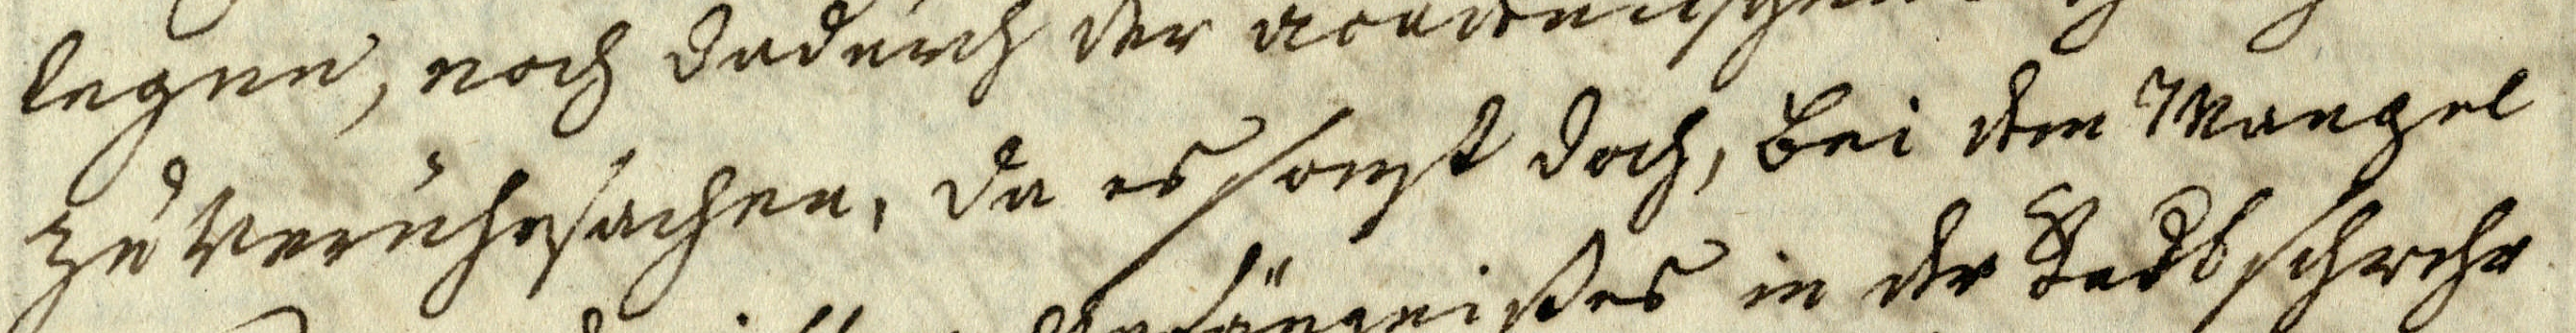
zu veruhrsachen, da es sonst doch, bei dem Mangel
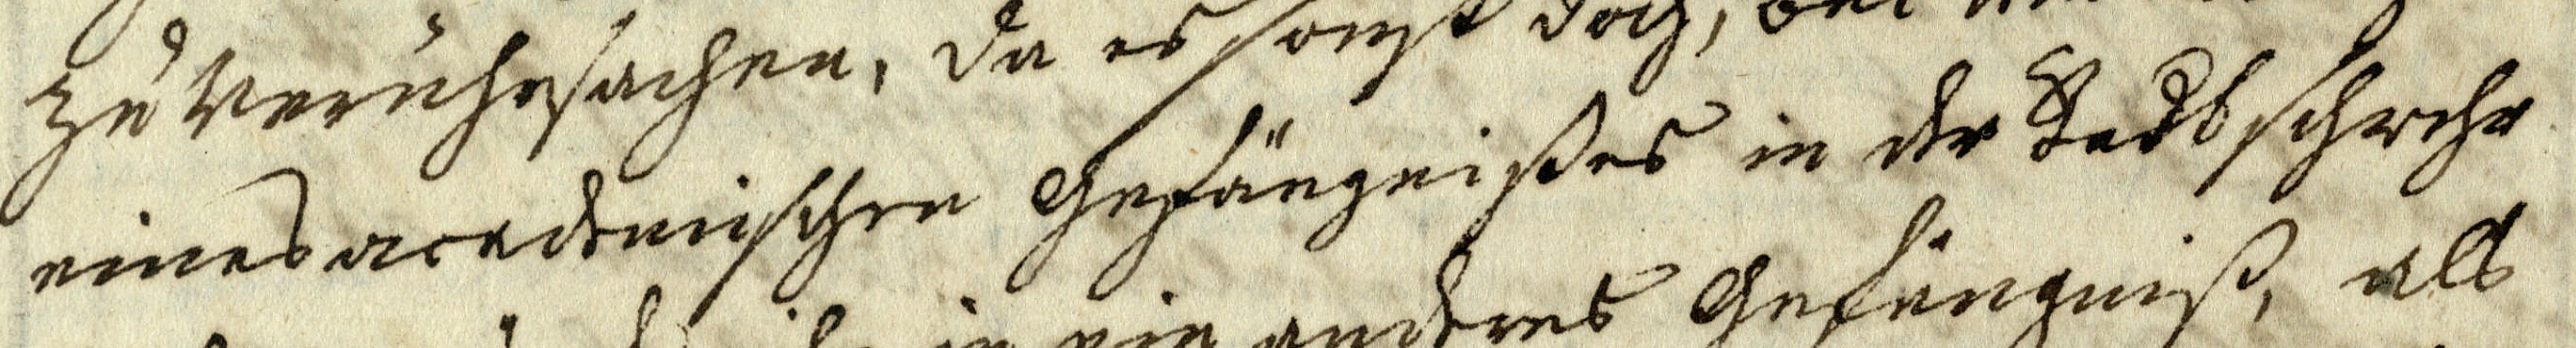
eines academischen Gefängnißes in der Stadt schwehr
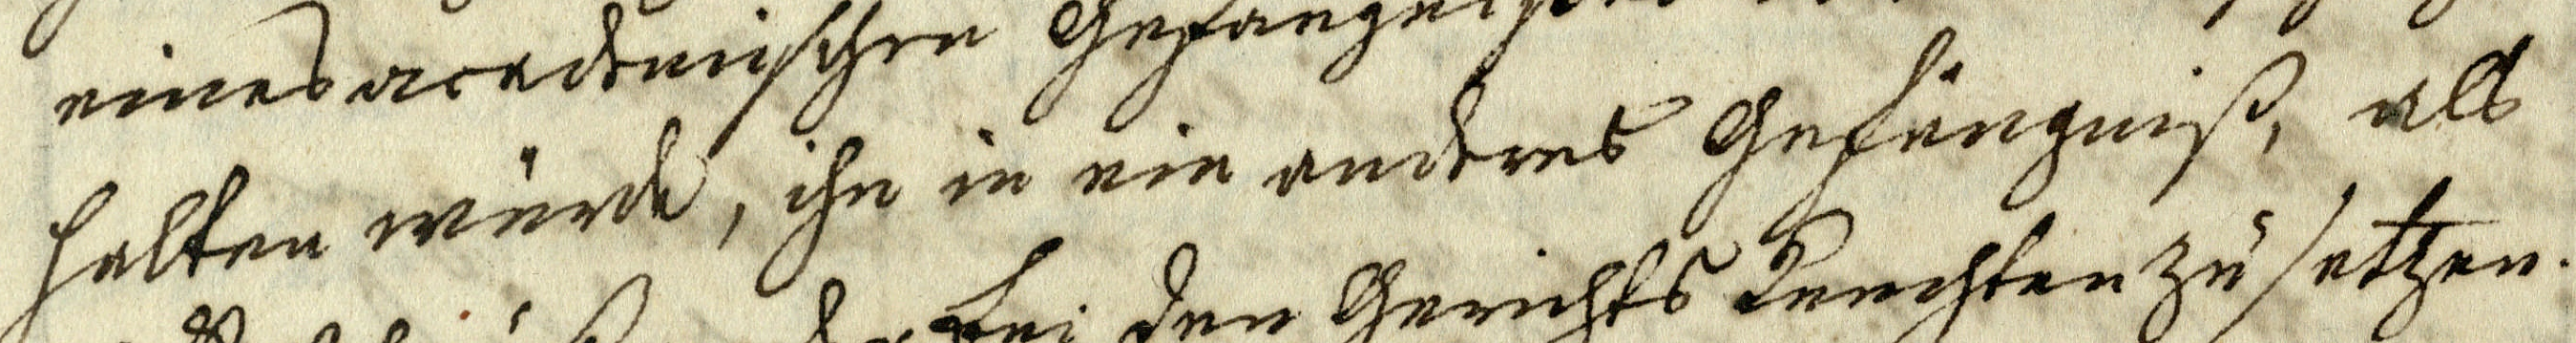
halten würde, ihn in ein anderes Gefängniß, als
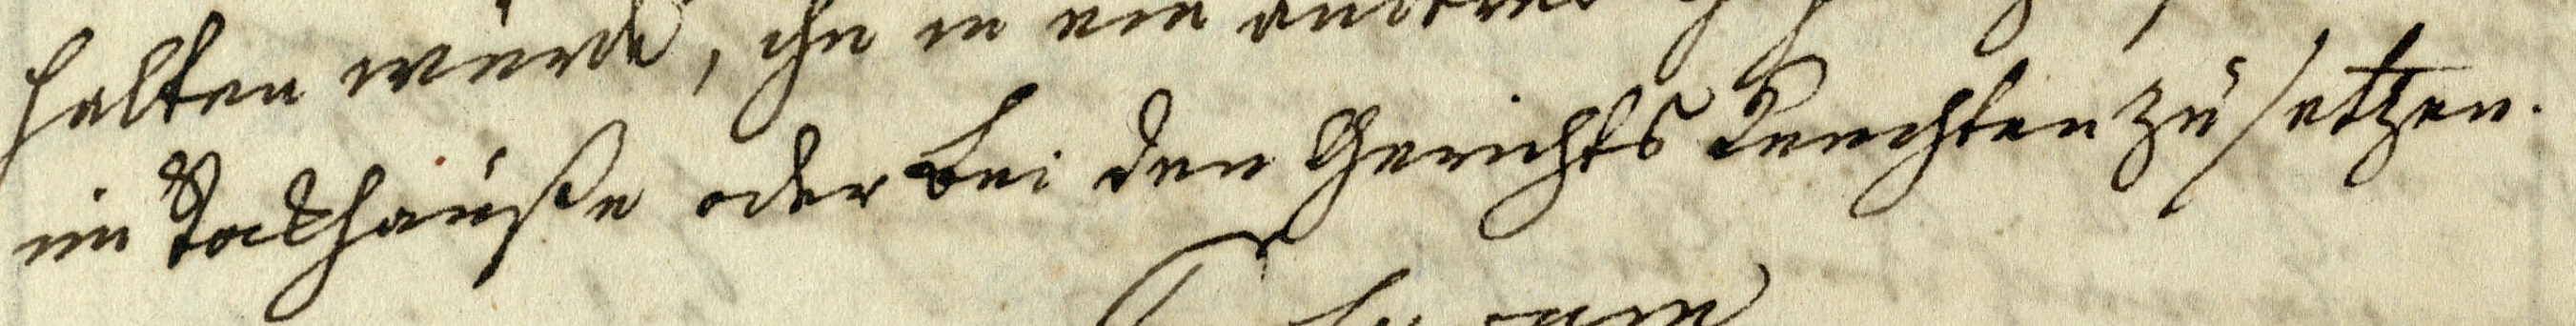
im Stockhause oder bei den Gerichts Knechten zu setzen.
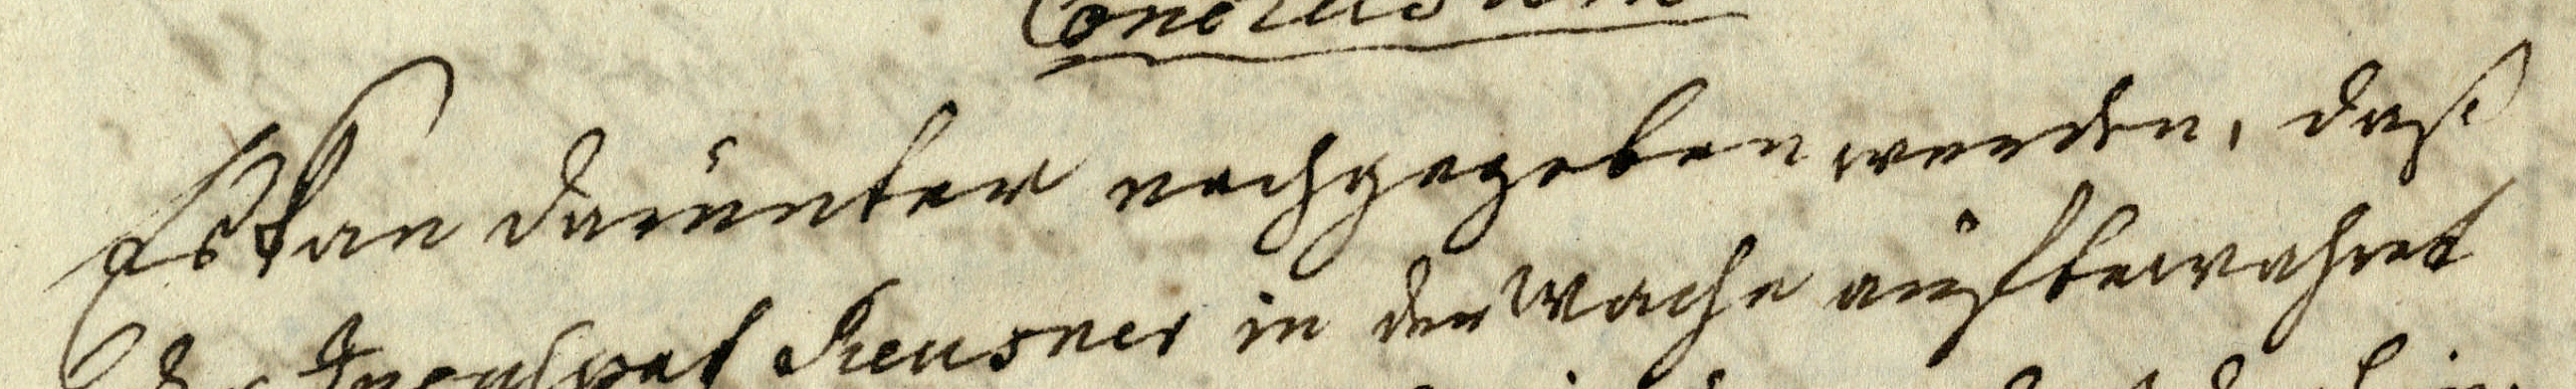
Es kan darunter nachgegeben werden, daß
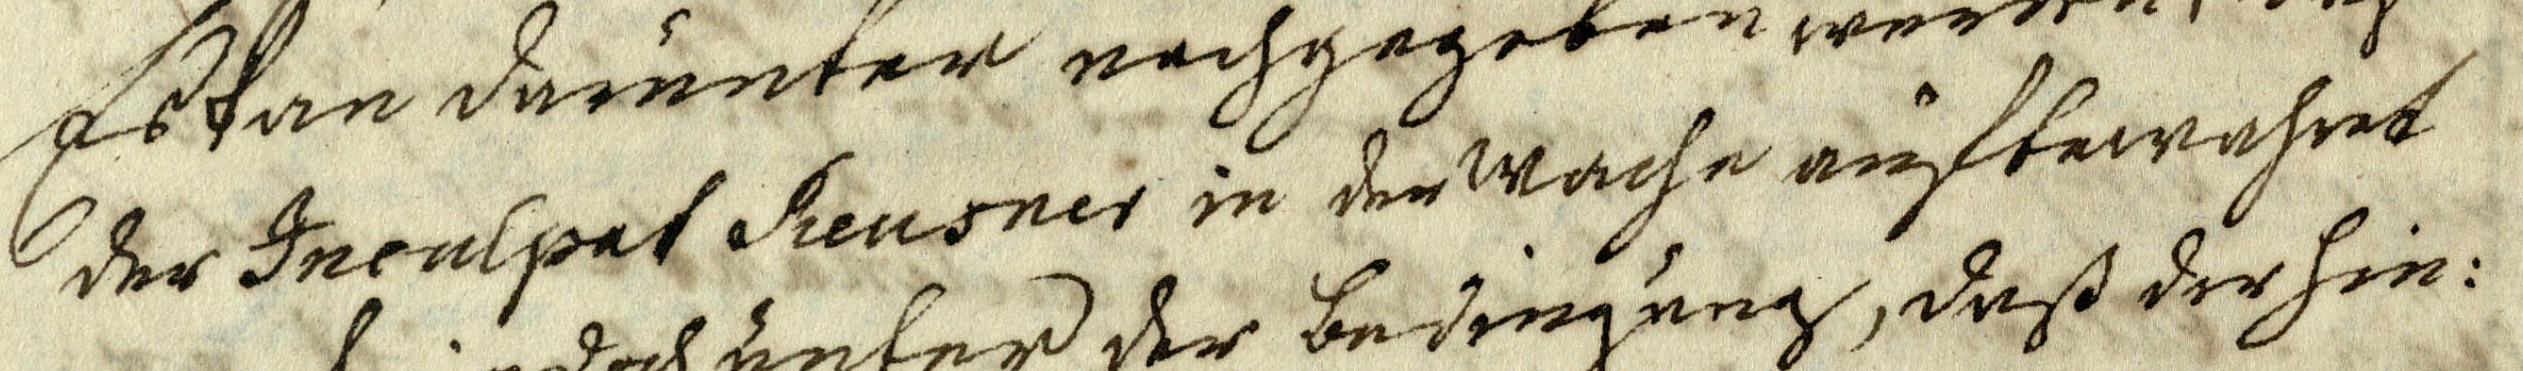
der Inculpat Reusner in der Wache aufbewahret
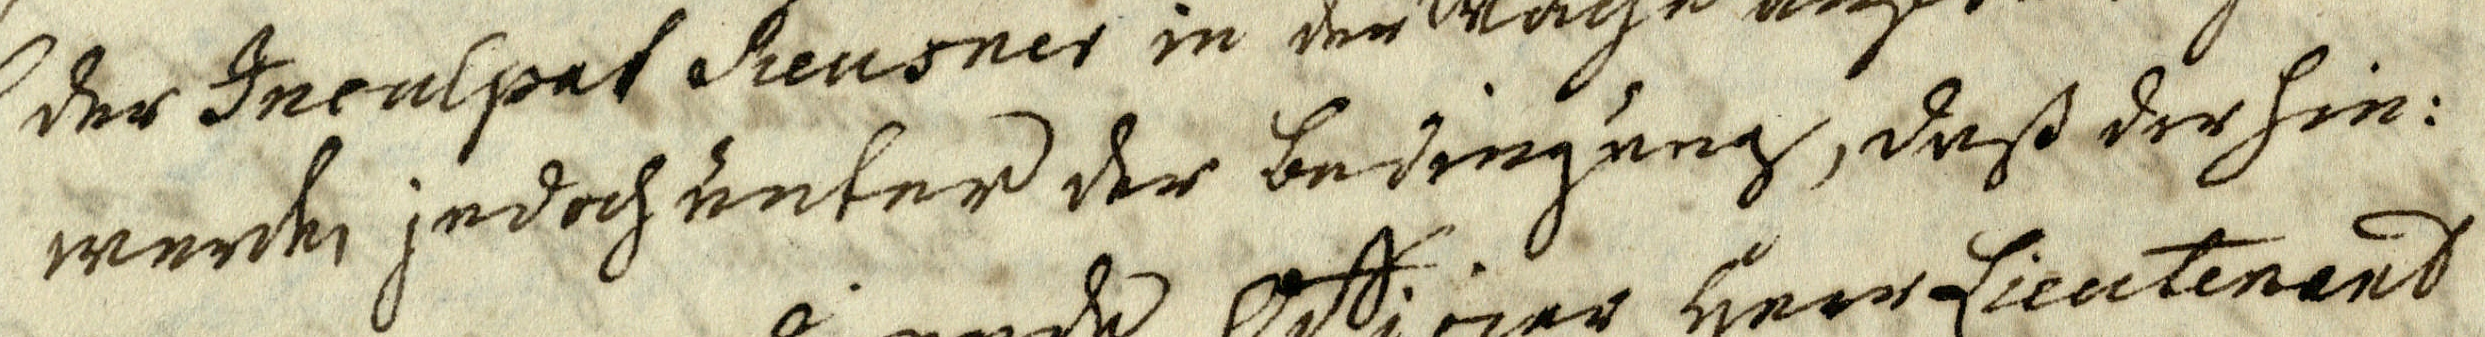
werde, jedoch unter der Bedingung, daß der hie¬
